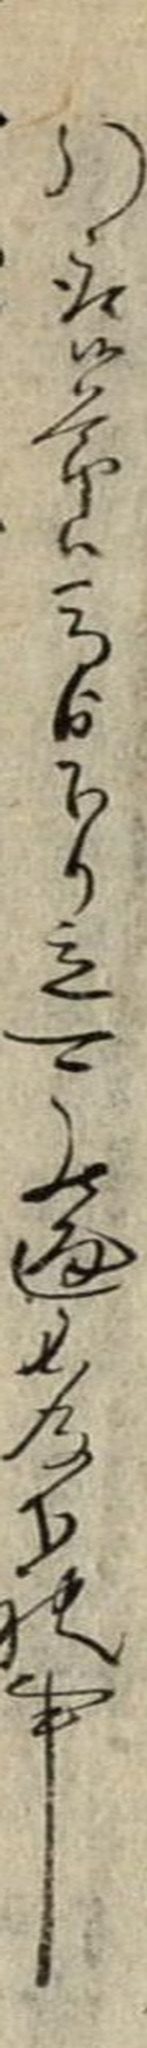引取候節は馬ゟ下り立可罷通不及下礼事
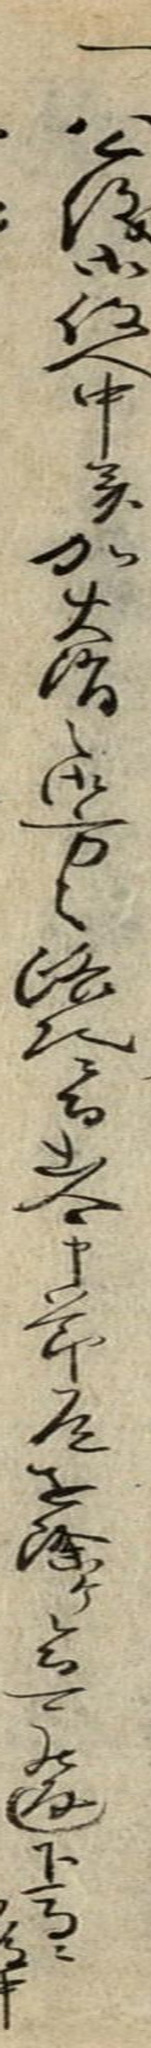一公儀御役人中并加火消之御方々路次にて出合申節道を除け候て可罷通下馬に不及事
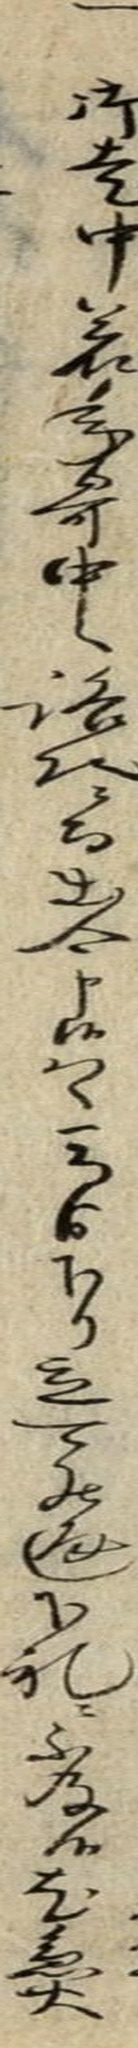一御老中若年寄中へ路次にて出合申候はゝ馬ゟ下り立可罷通下礼に不及候尤急火
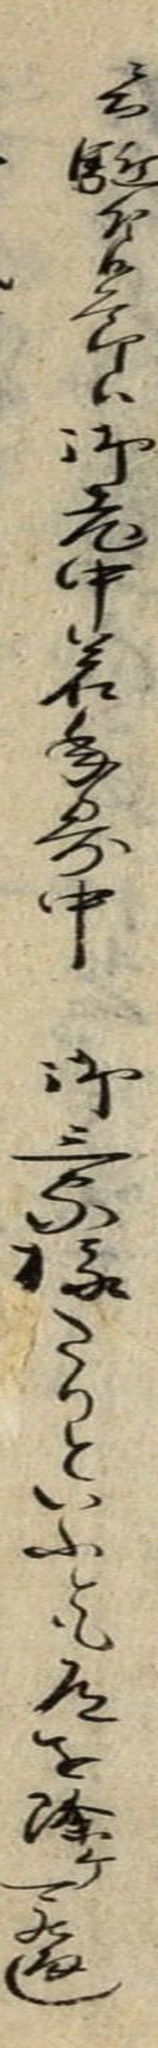にて駆付候節は御老中若年寄中御三家様たりといふとも道を除け可罷通
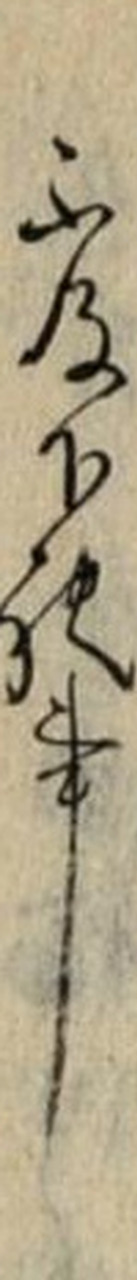不及下礼事
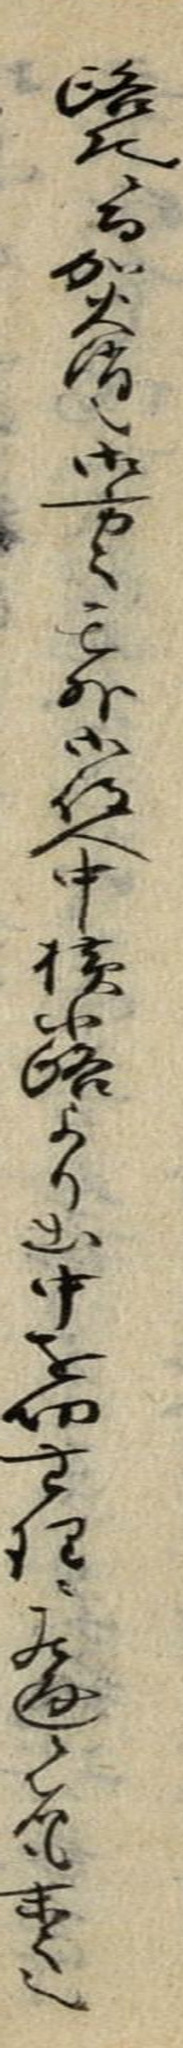一路次にて加火消之御方々其外御役人中横小路より出中を切無理に罷通候者も末々之
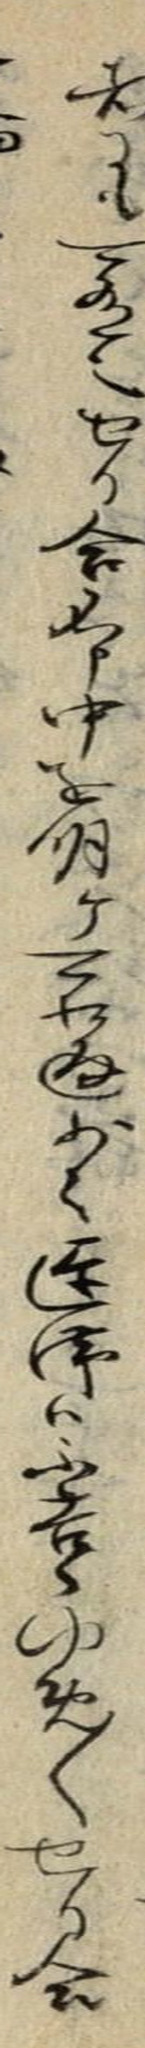者にも可有之せり合不申中を明け可相通少々遅滞は不苦候ゆめ〳〵せり合
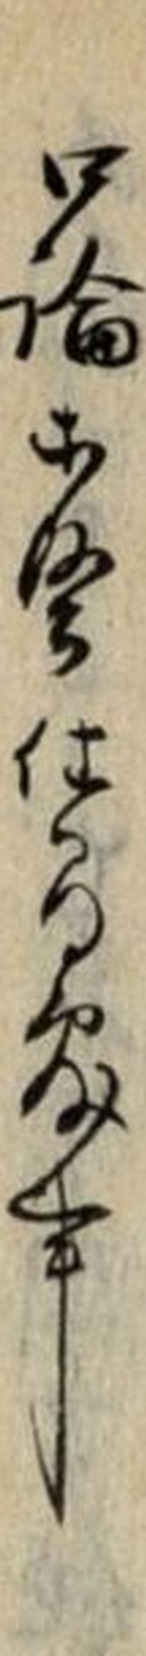口論等堅仕間敷事
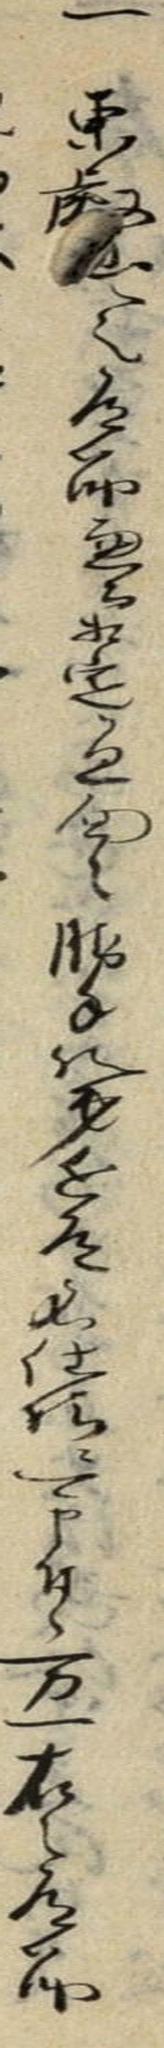一東叡山へ之道筋兼て相定置面々勝手次第近道不仕様に可申付候万一右之道筋
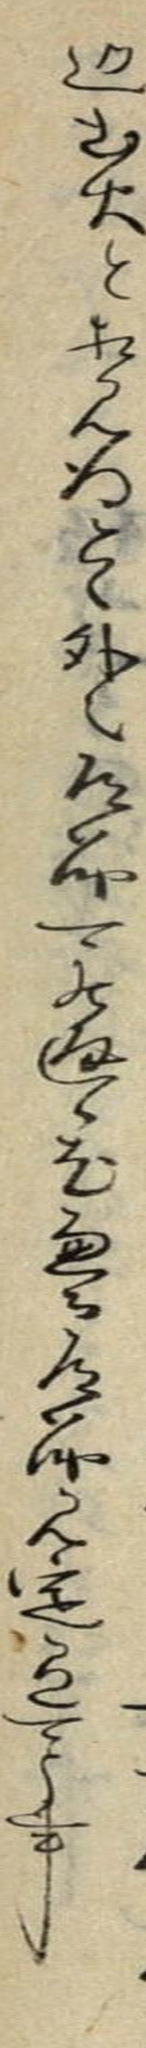辺出火と相見得候はゝ外之道筋可相通候尤兼て道筋見定置可申事
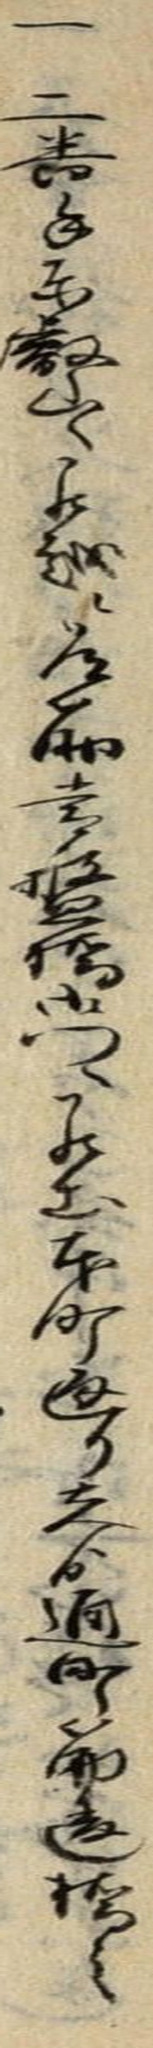一二番手東叡山へ罷越候道筋常盤橋御門へ罷出本町通り夫ゟ通町筋違橋之
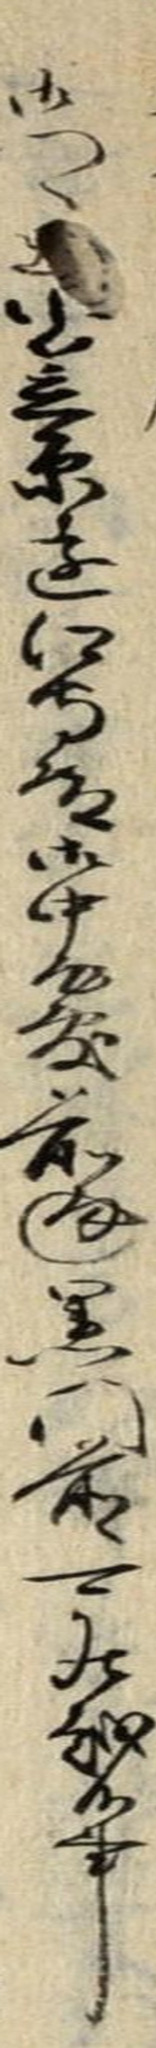御門へ出小笠原遠江守殿御中屋敷前通黒門前へ可罷越候事
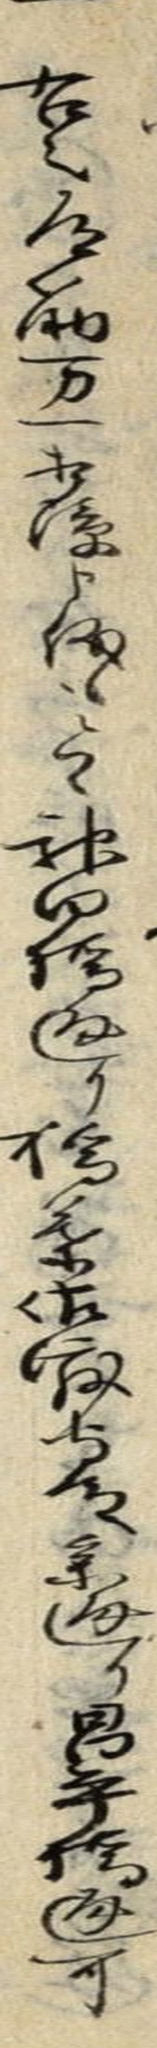一右之道筋万一相障申儀も候はゝ神田橋通り稲葉佐渡守殿参通り昌平橋通可
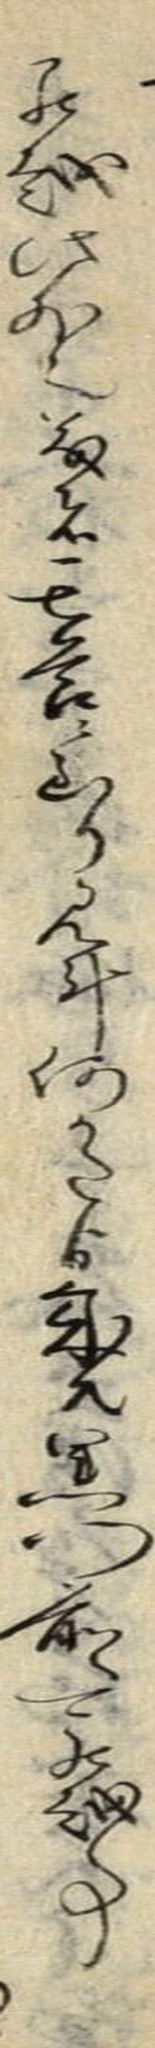罷越此外之義は其節に至り見計何かたゟ成共黒門前へ可罷越事
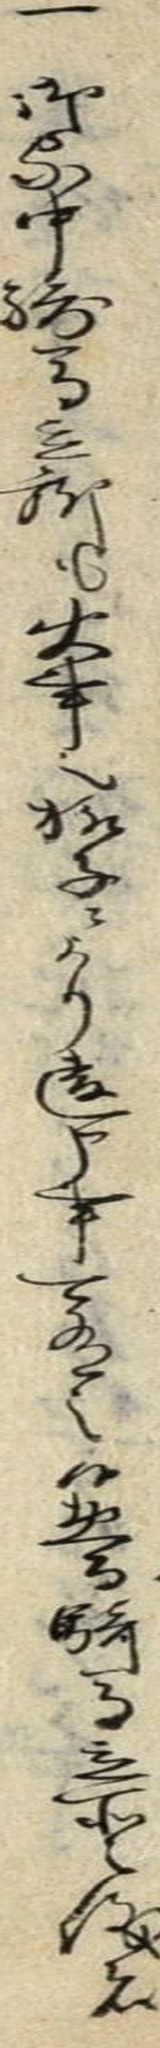一御家中騎馬立所も火事の様子により違申事可有之候惣て騎馬立所之儀は
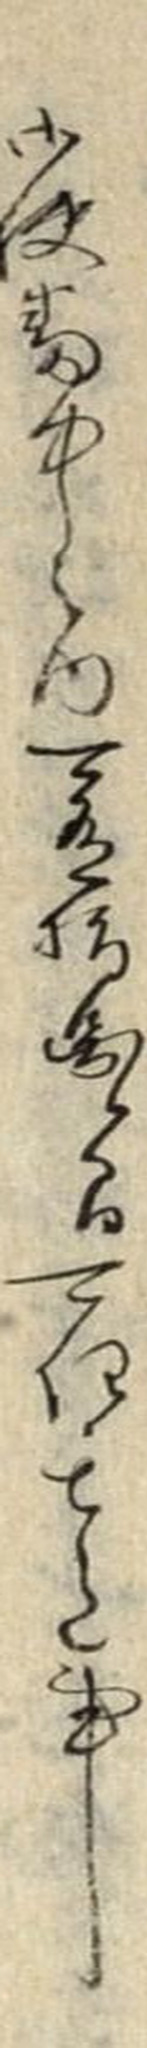御使番中之内可有指図候間可任其意事
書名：三都并道中之部
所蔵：福井県文書館 Fukui Prefectural Archives
